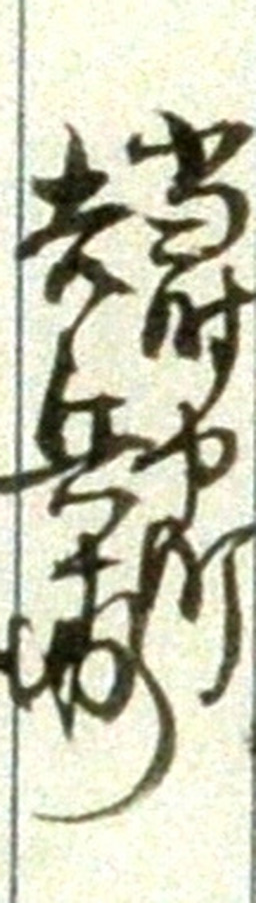吉兵衛
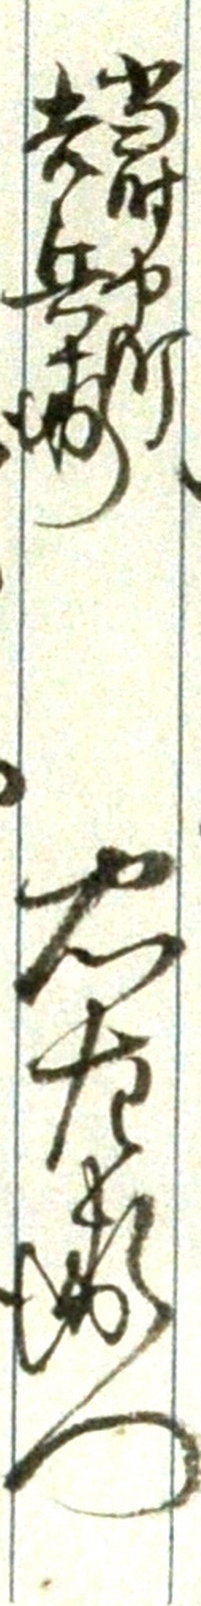当時中町忠左衛門
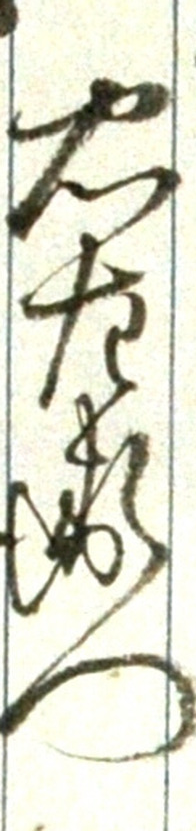藤左衛門
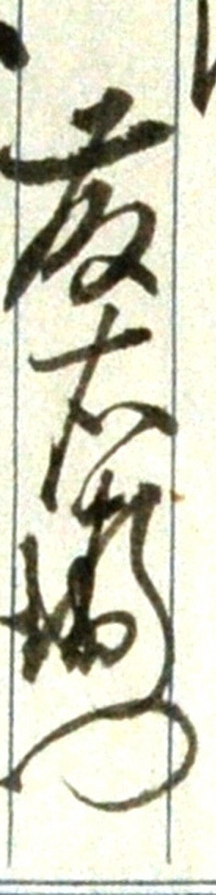藤左衛門
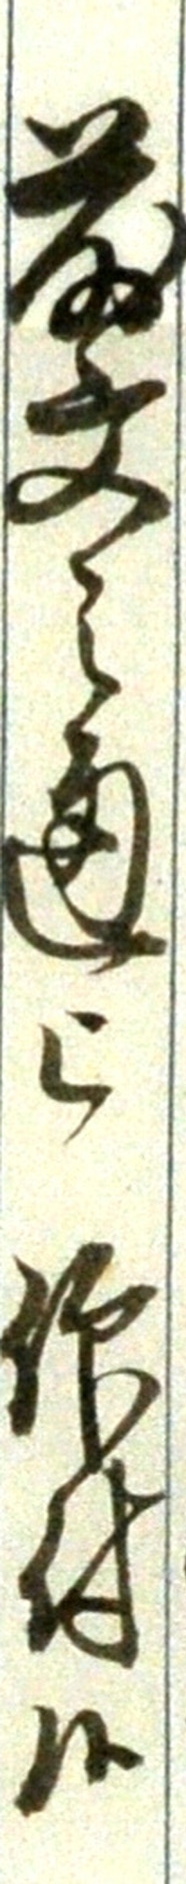前文之通被仰付候
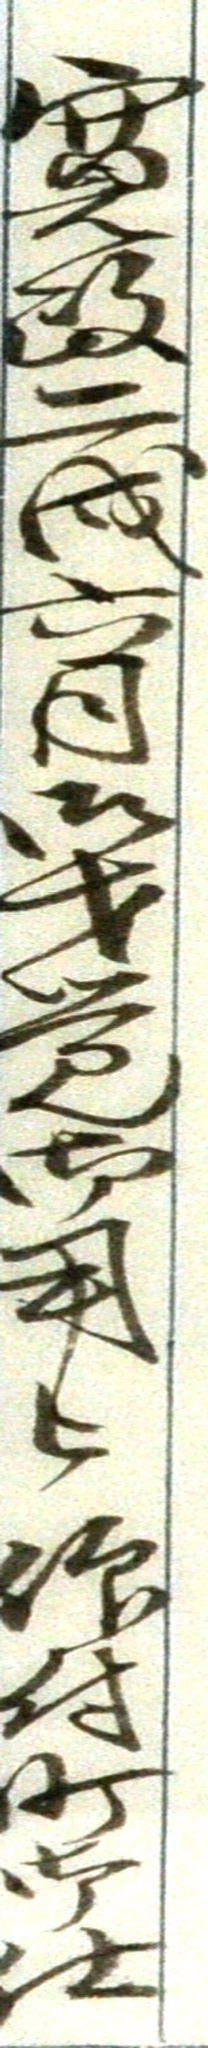寛政二戌六月御才覚御用被仰付町御仕
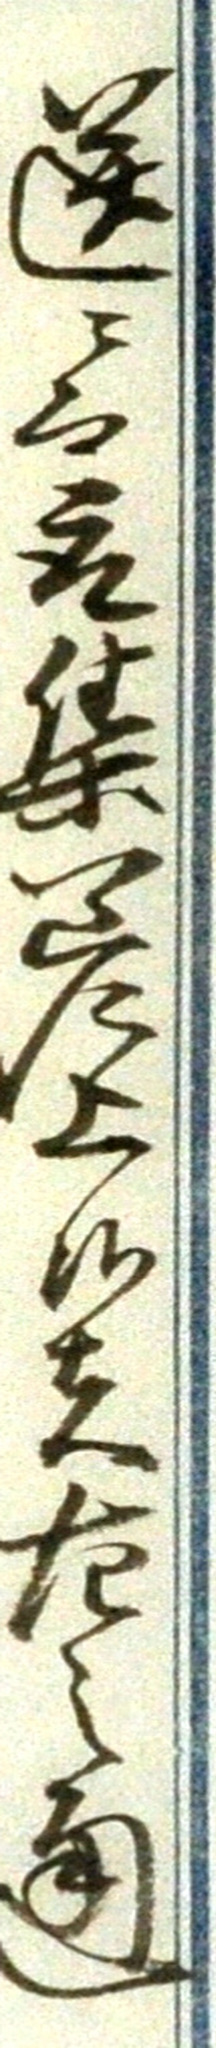送ニ而取集差上候者左之通
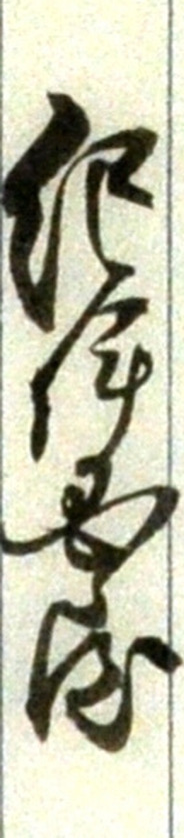紀伊国屋
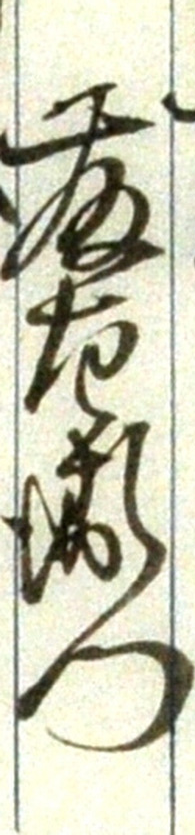藤左衛門
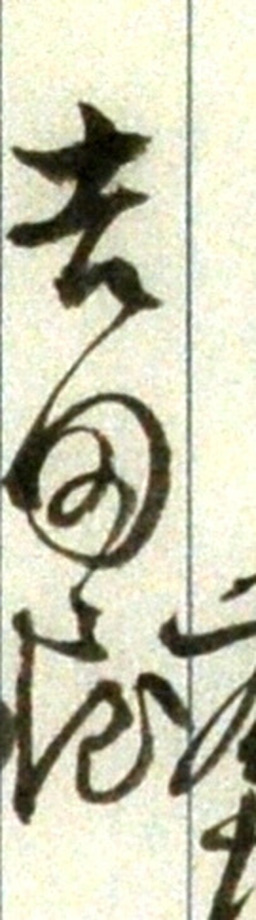吉田屋
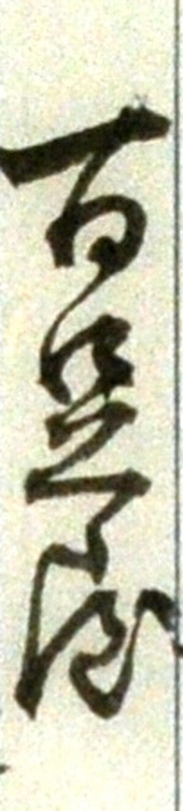百足屋
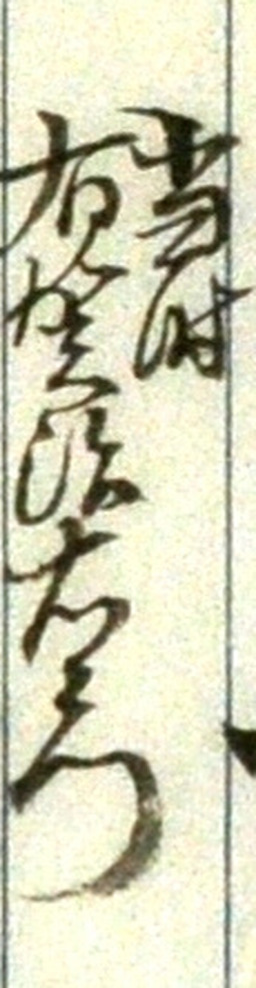有賀治右衛門
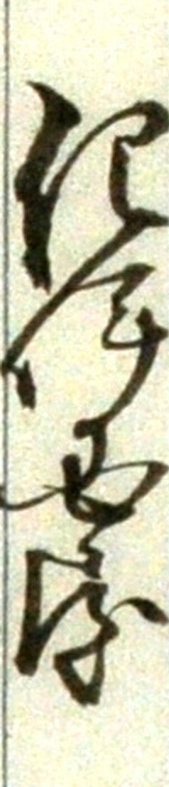紀伊国屋
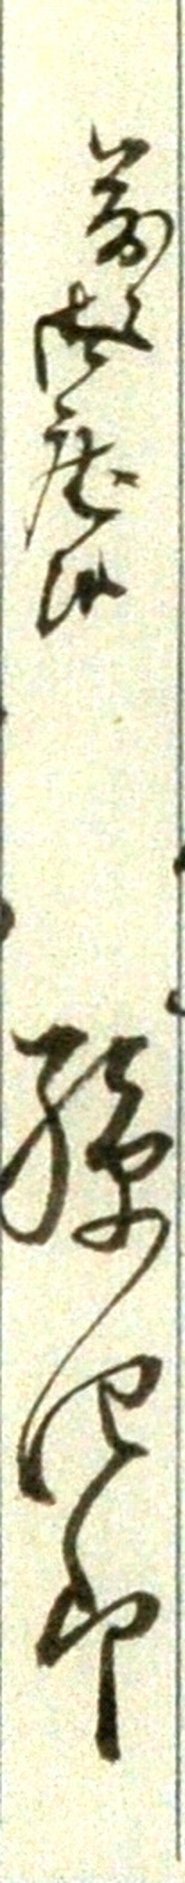前々御座候孫四郎
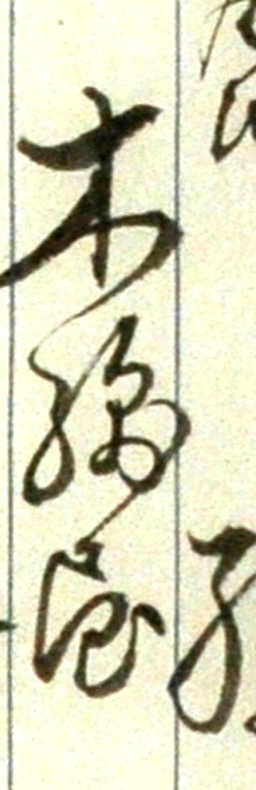木綿屋

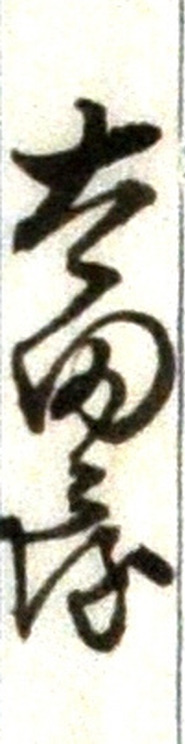太田屋
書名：御拝地以来御用達相勤候者名前
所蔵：伊那市立高遠町図書館・合同会社AMANE
